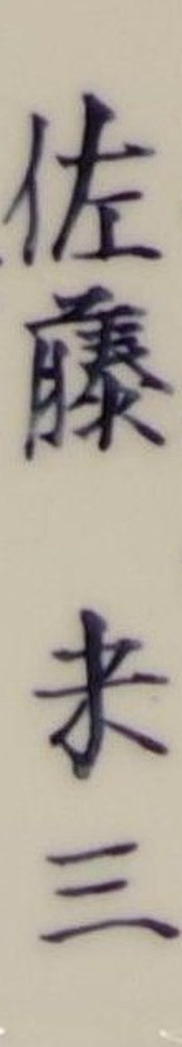佐藤米三
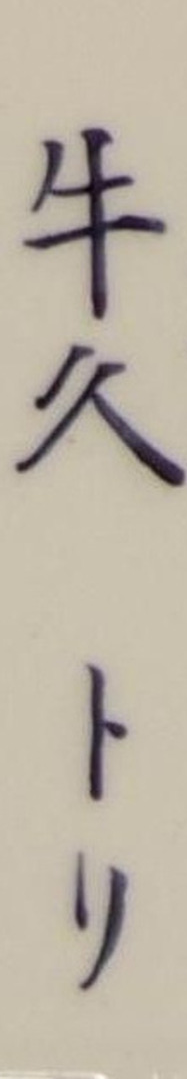牛久トリ
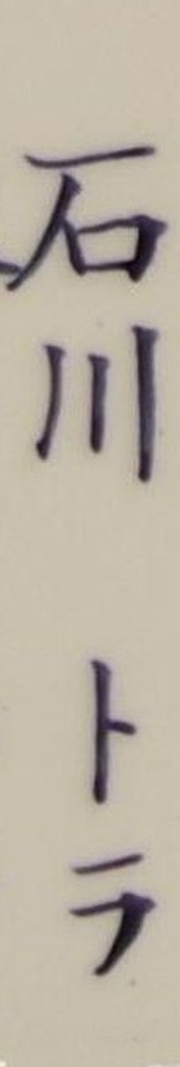石川トラ
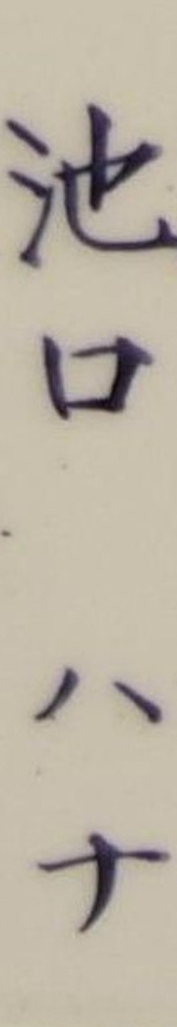池口ハナ
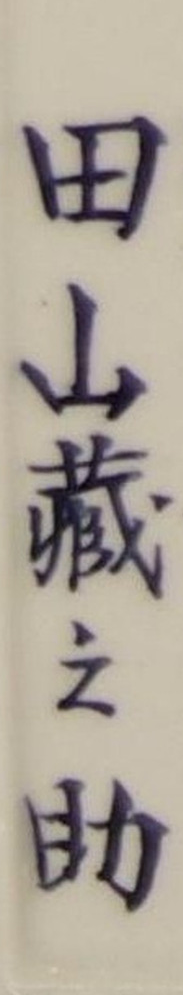田山蔵之助

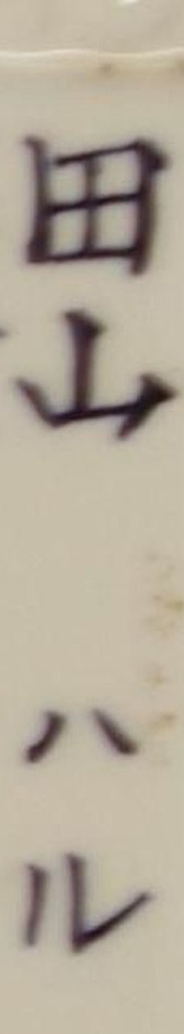田山ハル
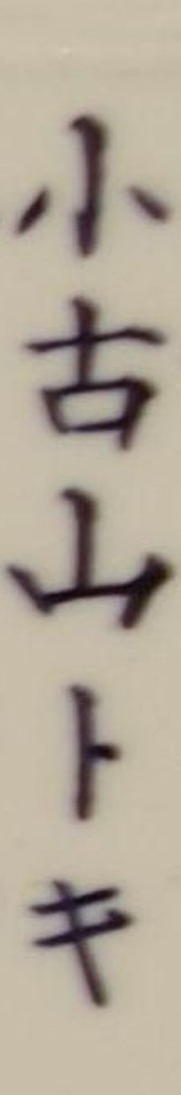小古山トキ
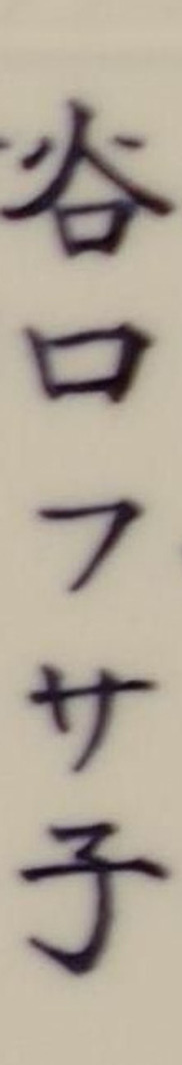谷口フサ子
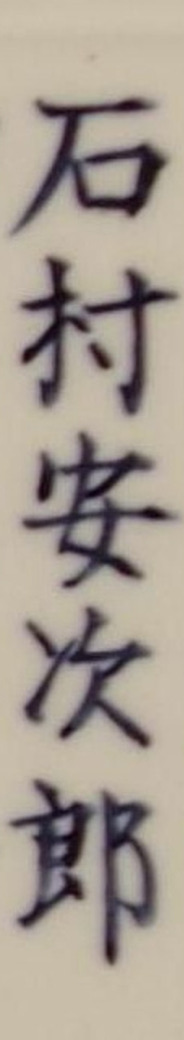石村安次郎
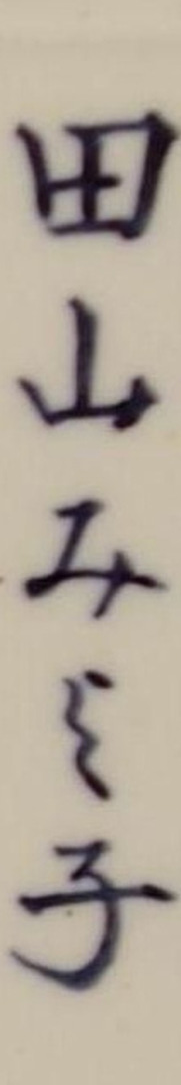田山みよ子
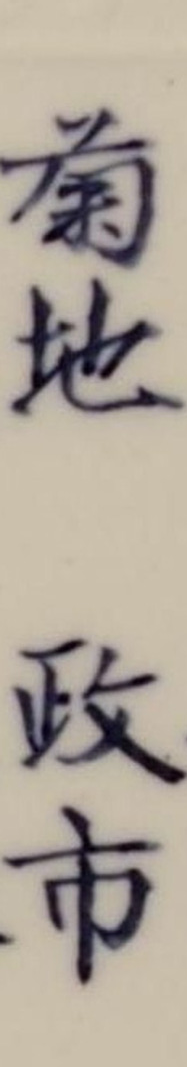菊地政市
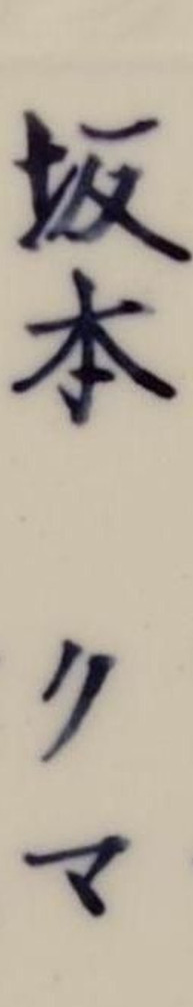坂本クマ
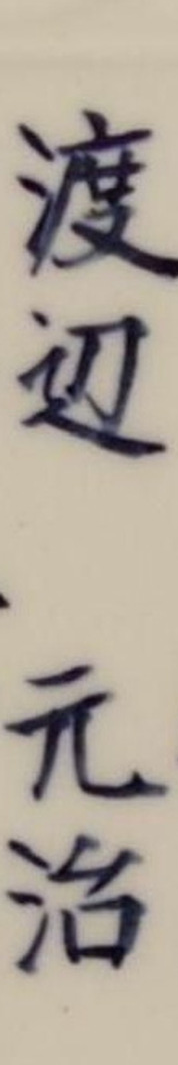渡辺元治
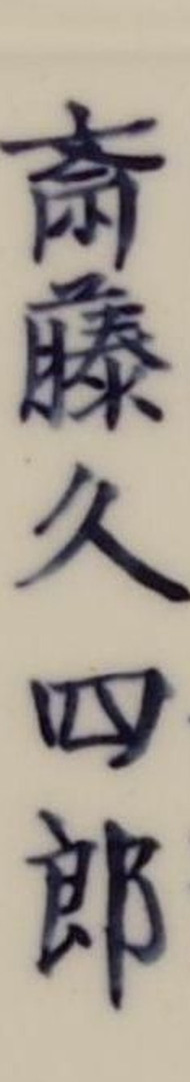斎藤久四郎
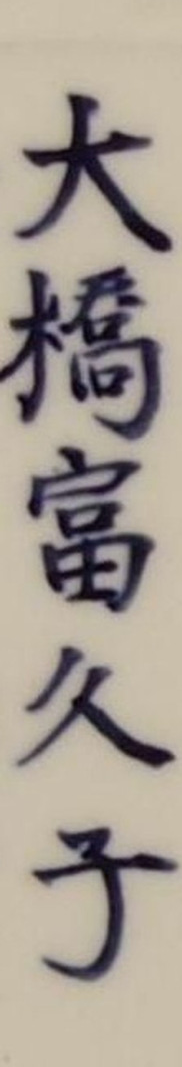大橋富久子
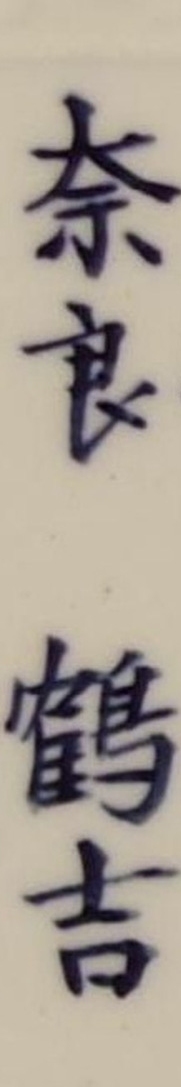奈良鶴吉
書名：E~L
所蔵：高野山金剛峯寺
